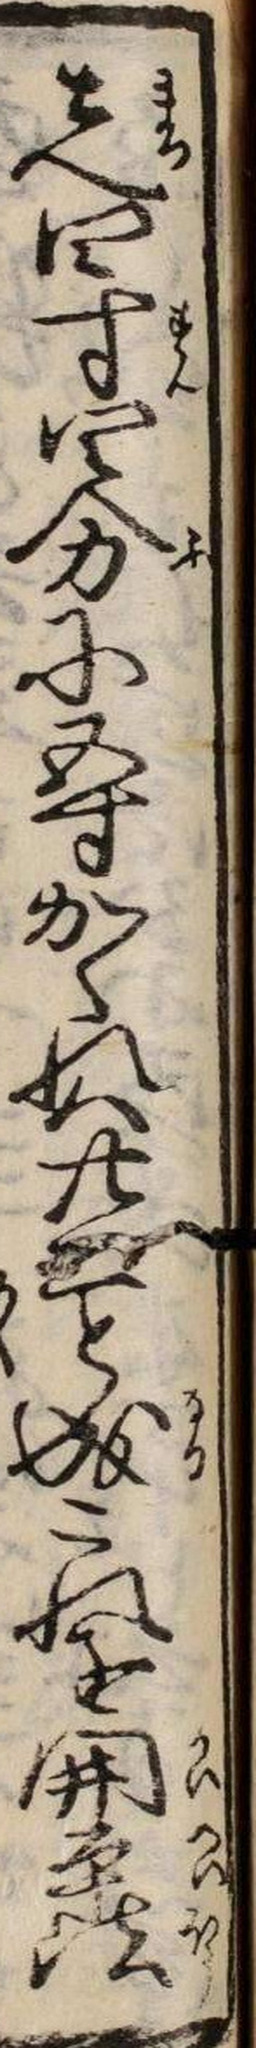先四寸四分に五寸かくれは廿二と成これを開平法
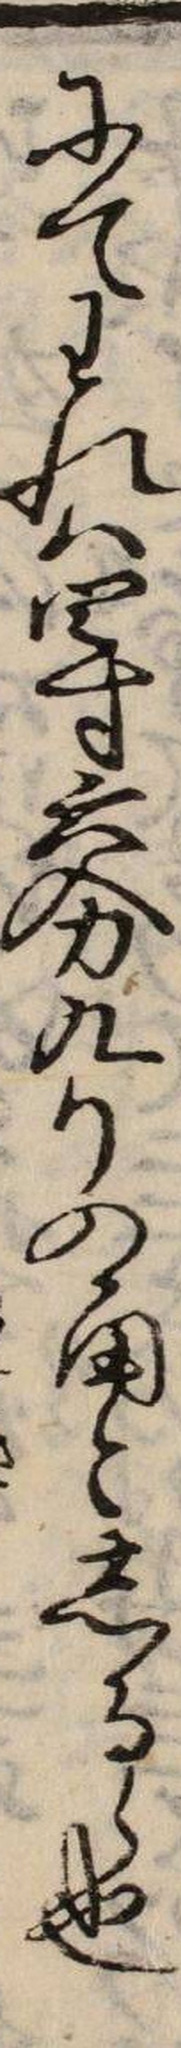にてわれは四寸六分九りの角としるゝ也
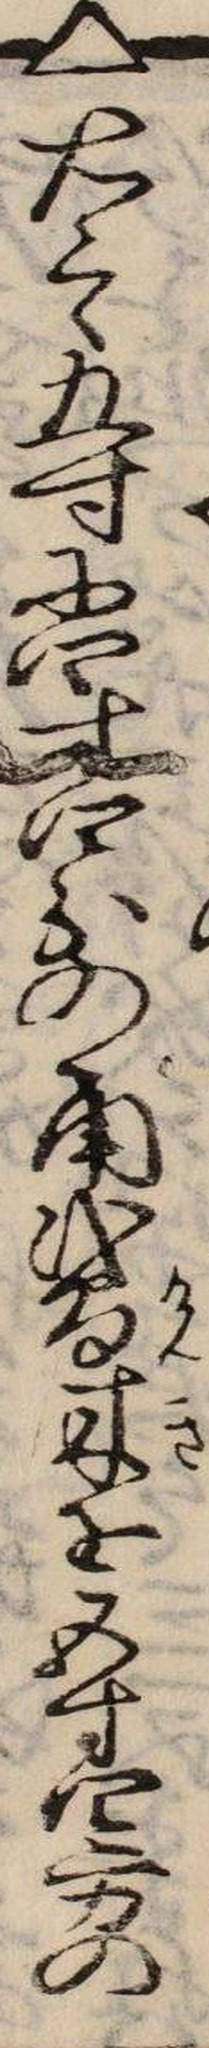△右の五寸に四寸四分の角弐間木を五寸四方の
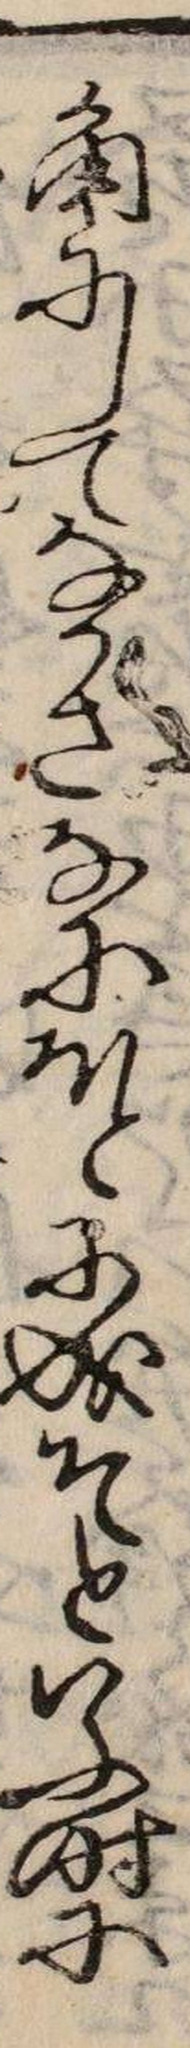角にしてなかさなにほとに成そといふ時に
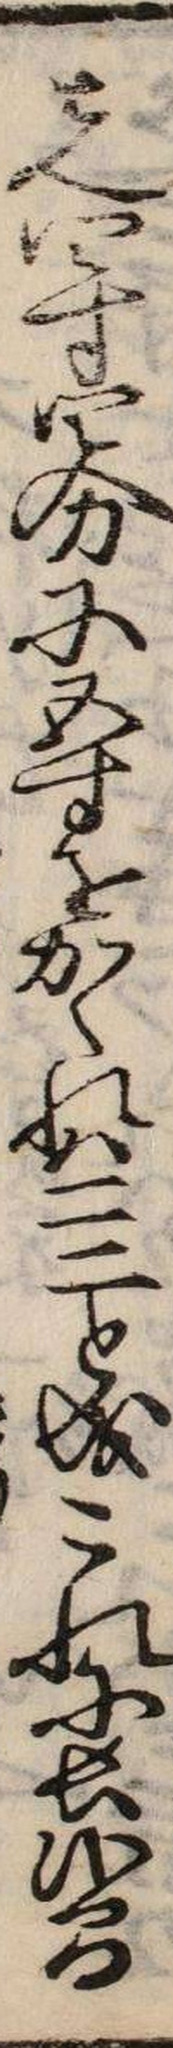先四寸四分に五寸をかくれは二二と成これに長弐間
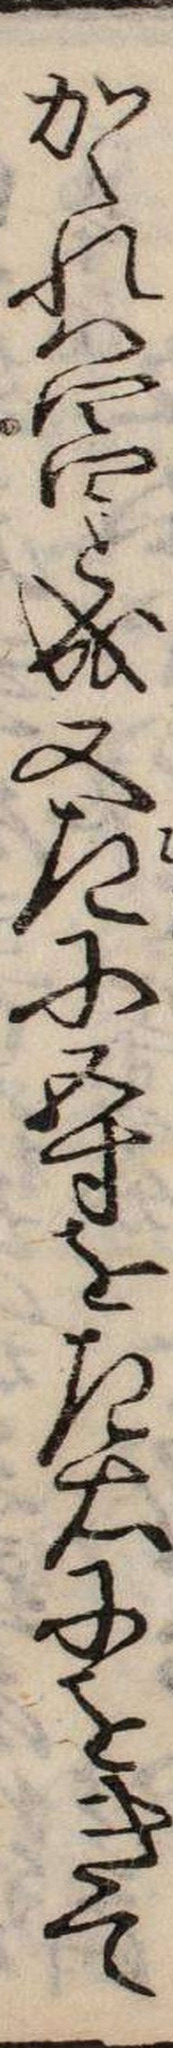かくれは四四と成又左に五寸を左右にをきて
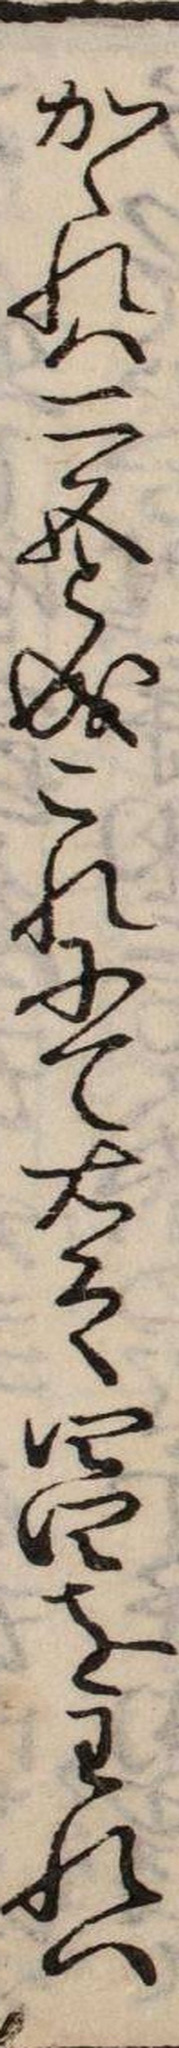かくれは二五と成これにて右の四四をわれは
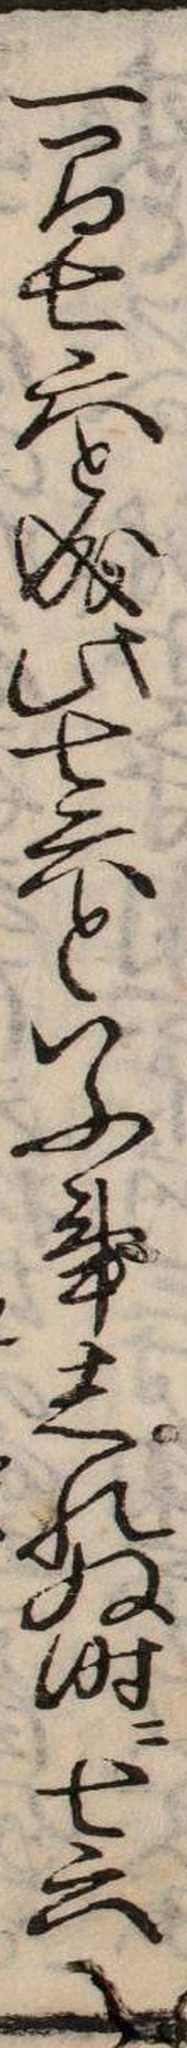一間七六と成此七六といふ事しれぬ時に七六
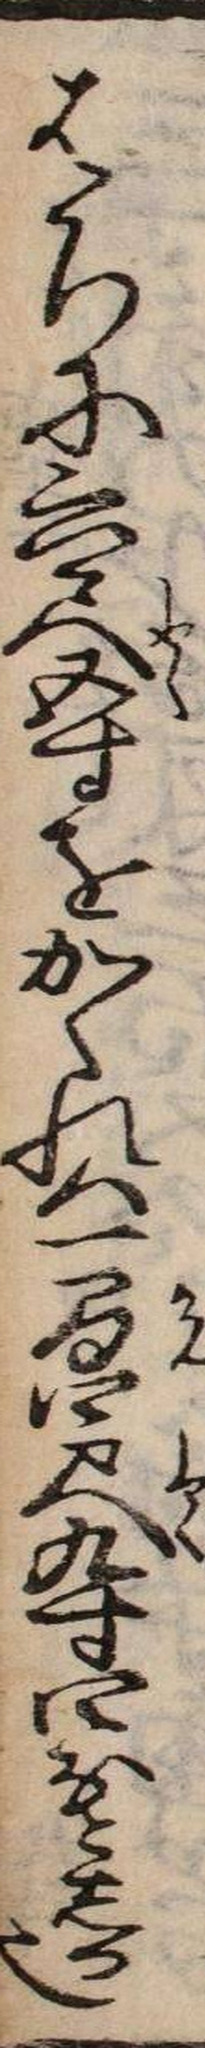はかりに六尺五寸をかくれは一間四尺九寸四分としる也

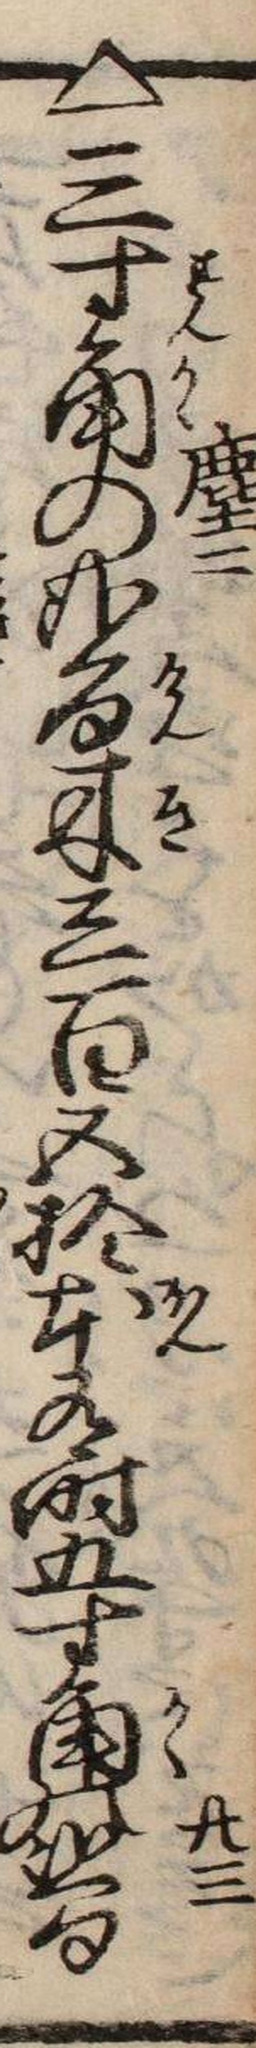△三寸角の弐間木三百五拾本有時五寸角の弐間
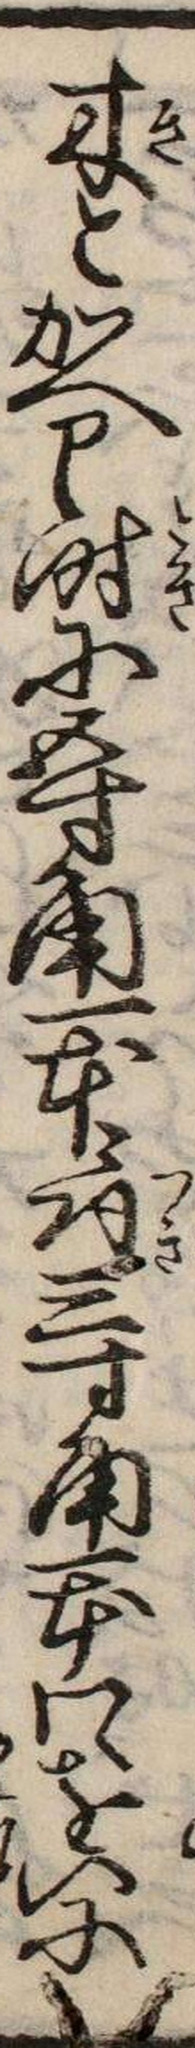木とかへ申候時に五寸角一本に付三寸角一本つゝをいに
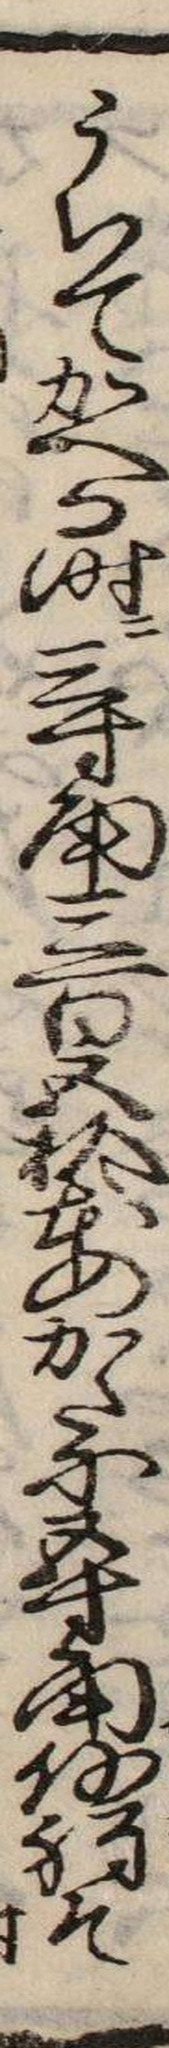うちてかへる時に三寸角三百五拾本のかたに五寸角何程そと云時
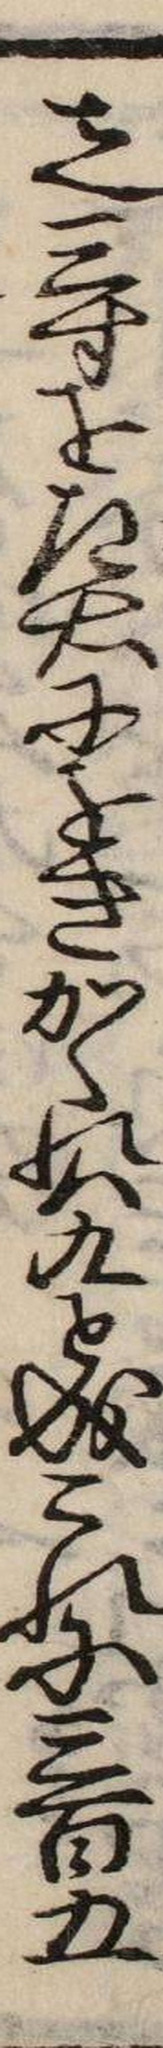先三寸を左右にをきかくれは九と成これに三百五
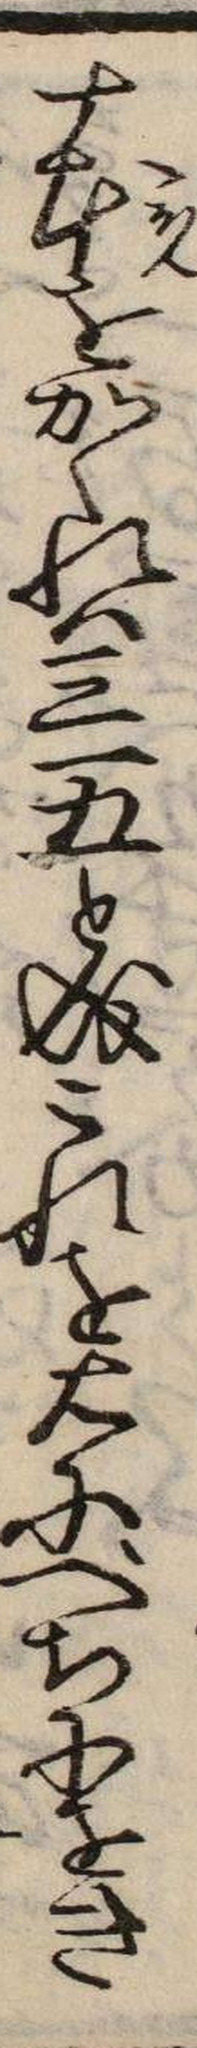十本をかくれは三一五と成これを右にべちにをき
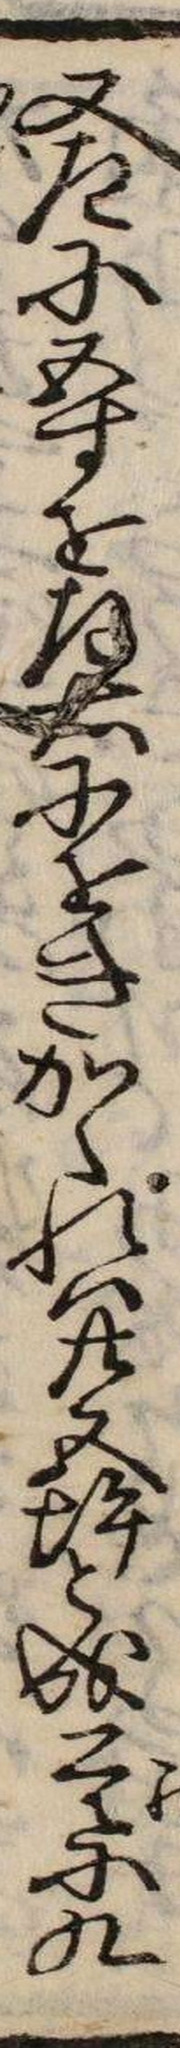又左に五寸を左右にをきかゝれは廿五坪と成是に九
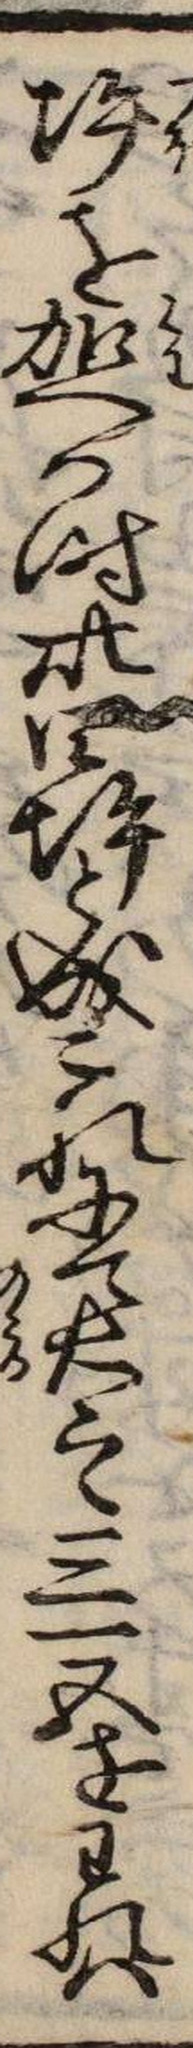坪を加へる時卅四坪と成これにて右の三一五をわれは
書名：塵劫記（寛永11年自跋、京都府立京都学・歴彩館追貴8）
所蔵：京都府立京都学・歴彩館 国文学研究資料館
